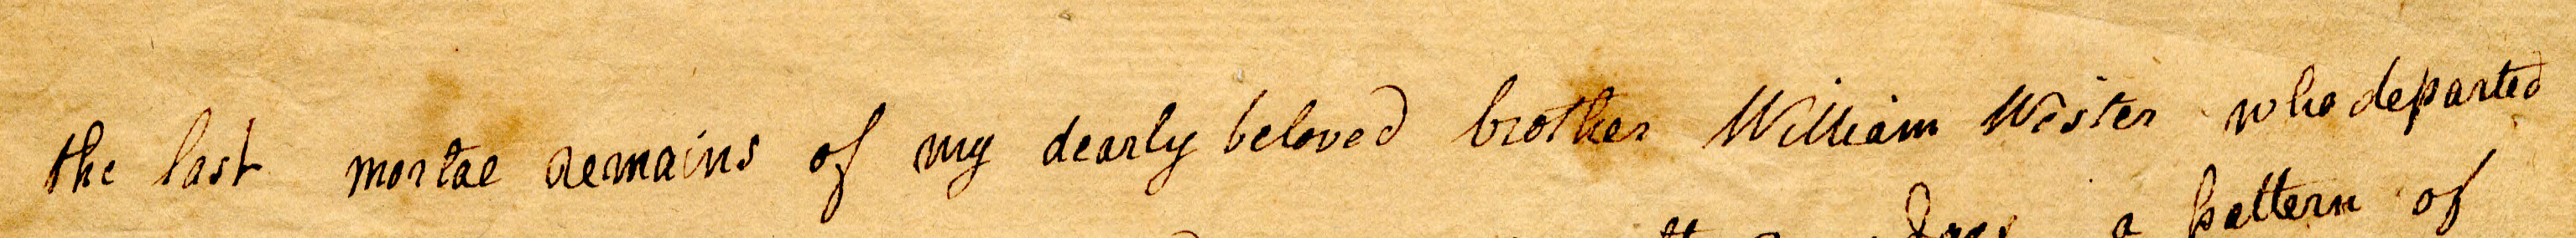the last mortal Remains of my dearly beloved brother William Wister who departed
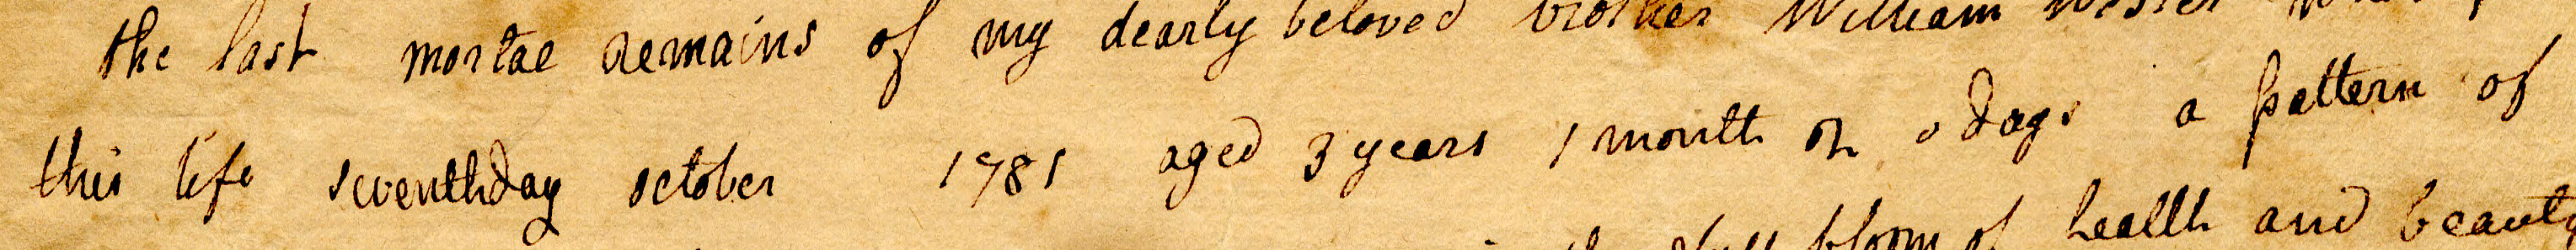this life seventhday october 1781 aged 3 years 1 month on a day a pattern of
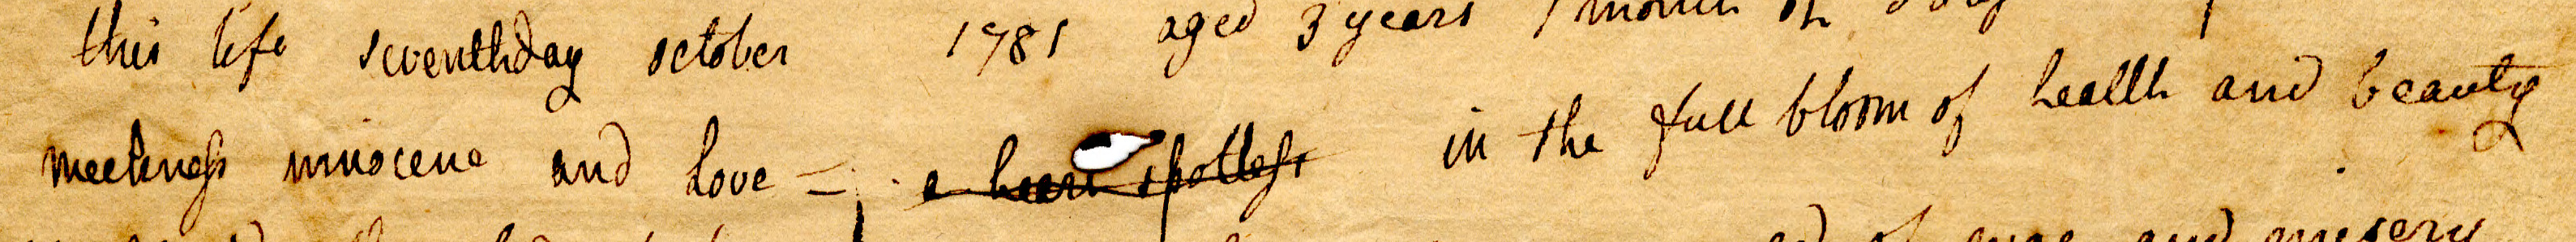meekness innocene and love [a heart spotless] in the full bloom of health and beauty
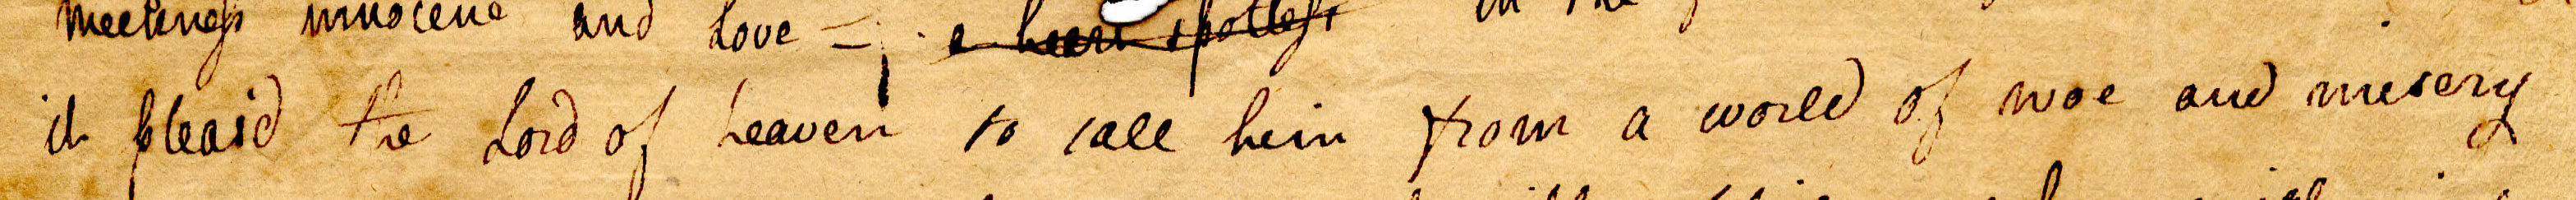it pleas'd the Lord of heaven to call him from a world of woe and misery
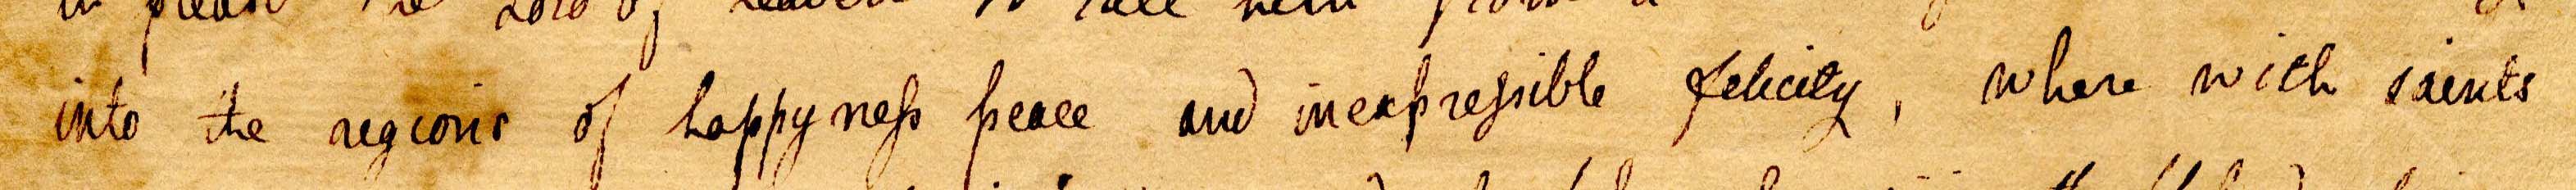into the regions of happyness peace and inexpressible felicity, where with saints
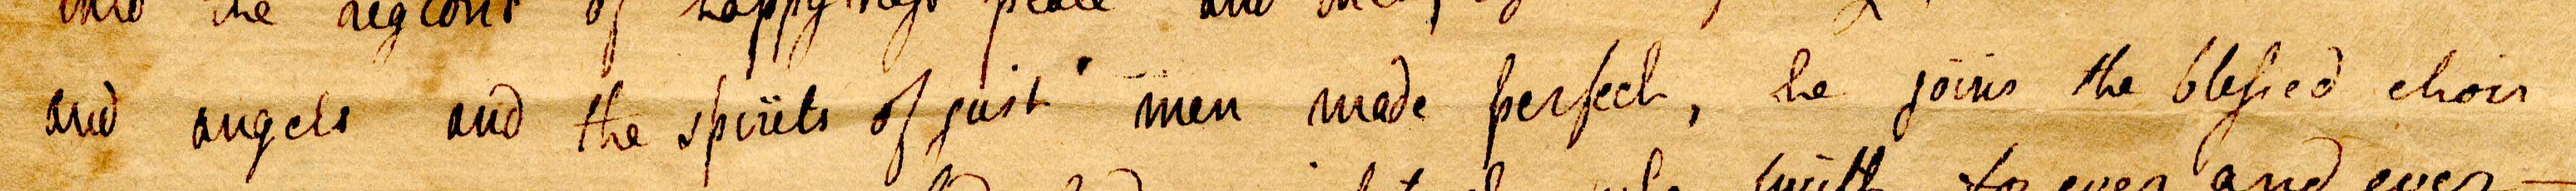and angels and the spirits of just men made perfect, he joins the blessed choir
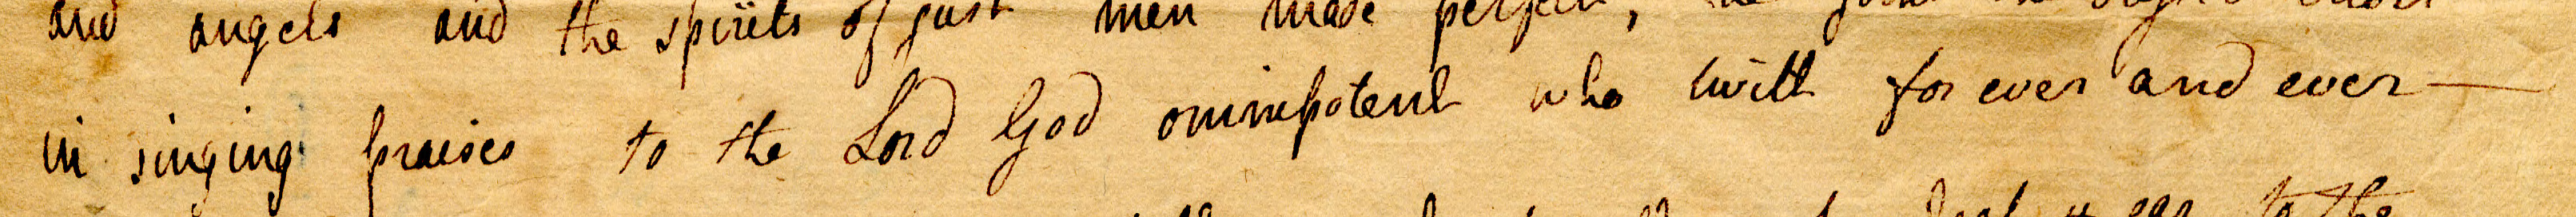in singing praises to the Lord God omnipotent who with for ever and ever-
